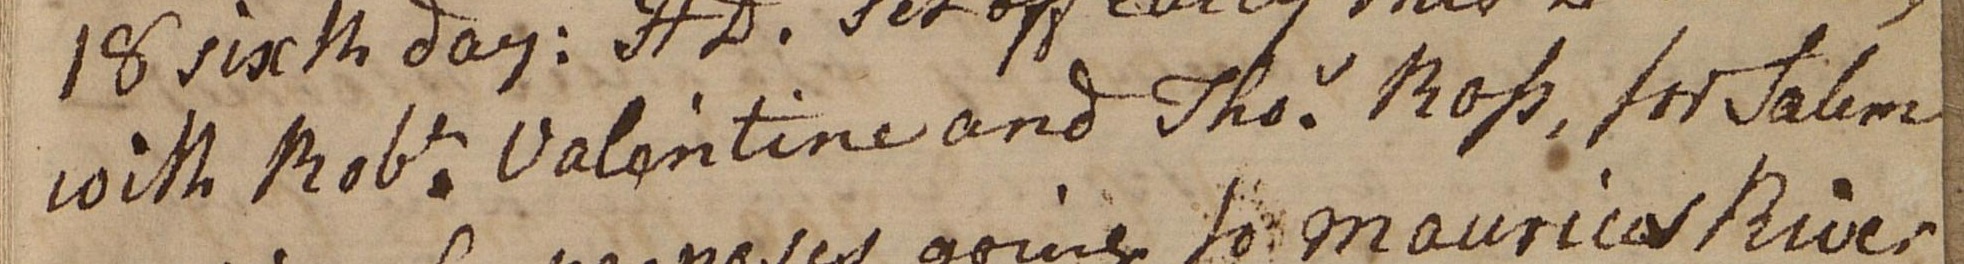with Rob^t. Valentine and Tho^s. Ross, for Salem
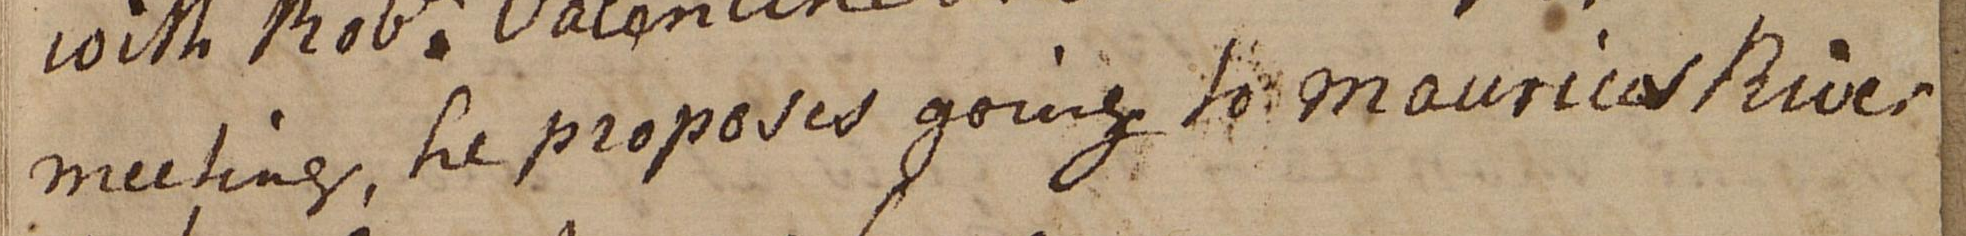meeting, he proposes going to Maurices River
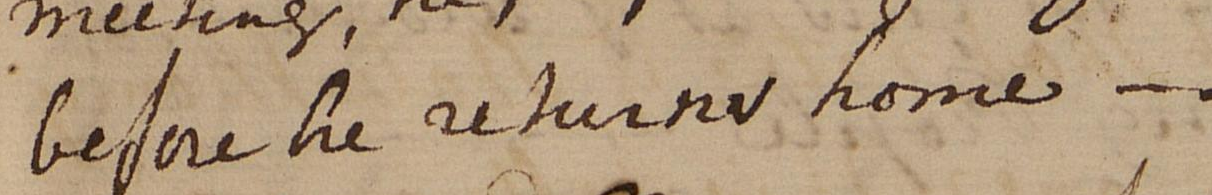before he returns home-
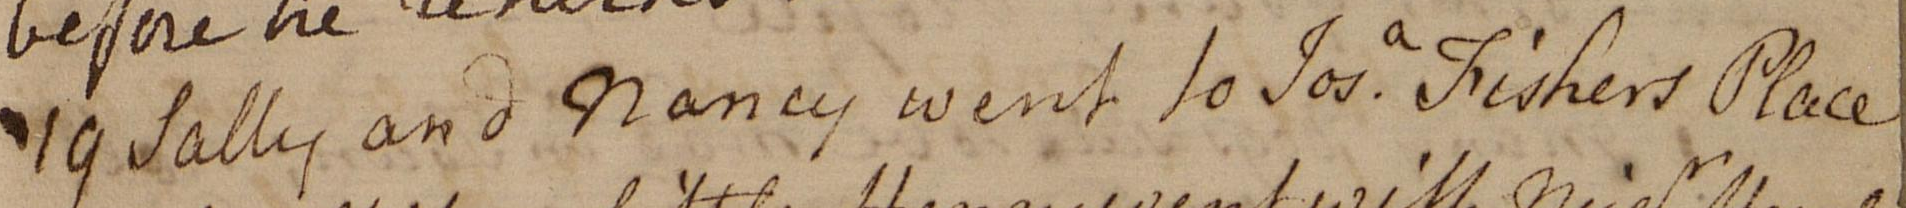19 Sally and Nancy went to Jos^a. Fishers Place
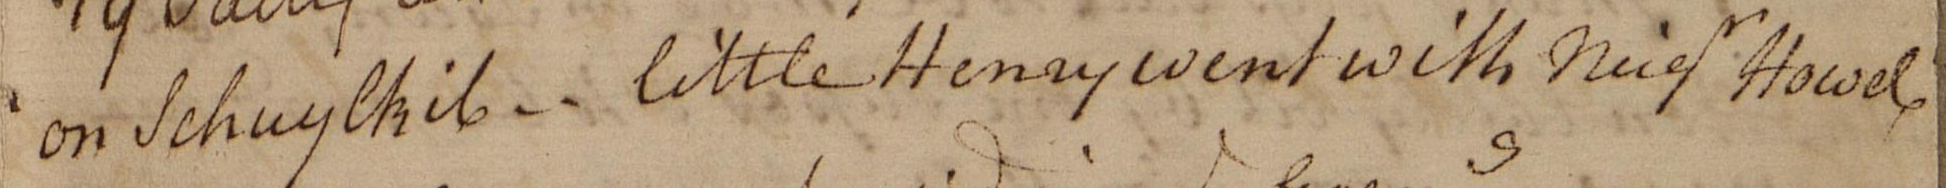on Schuylkil- little Henry went with Neig^r Howel
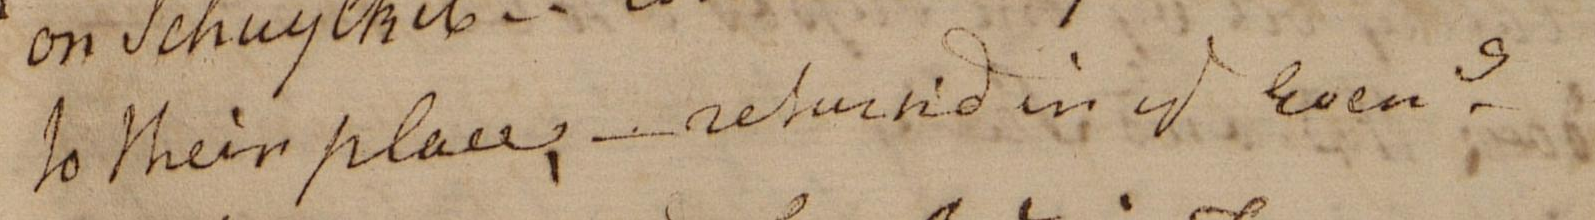to their place,- return'd in y^e even^g
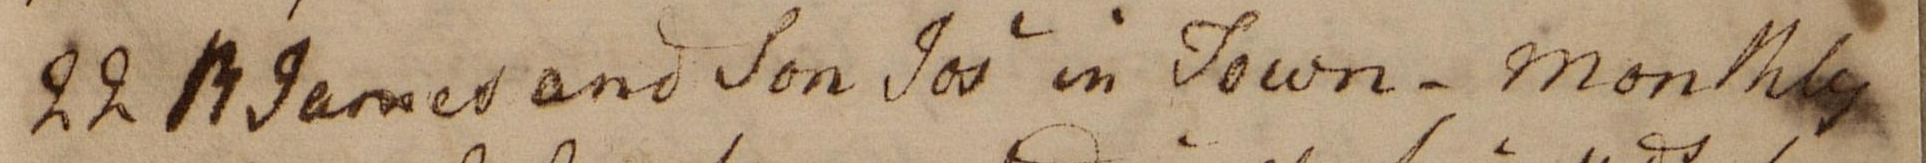22 R James and Son Jos^a in Town- Monthly
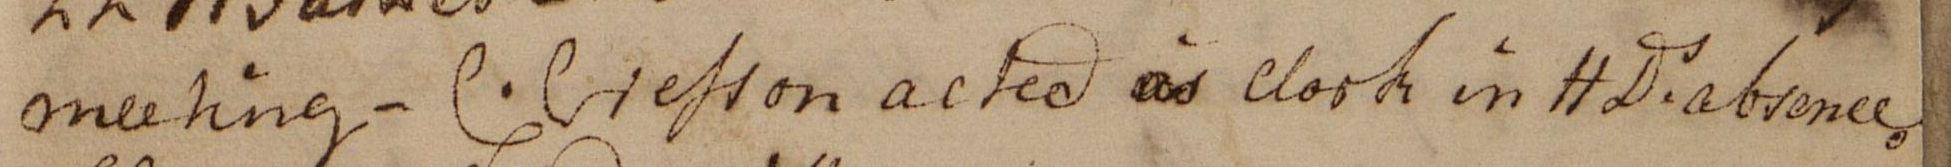meeting- C. Cresson acted [as] clork in HD^s. absence
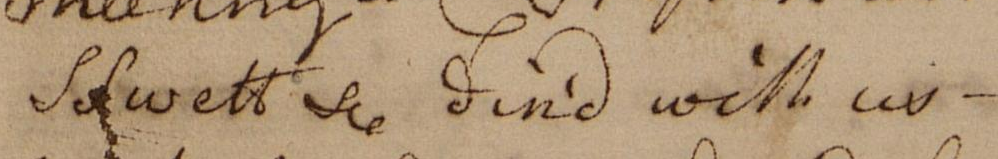S Swett ^c din'd with us
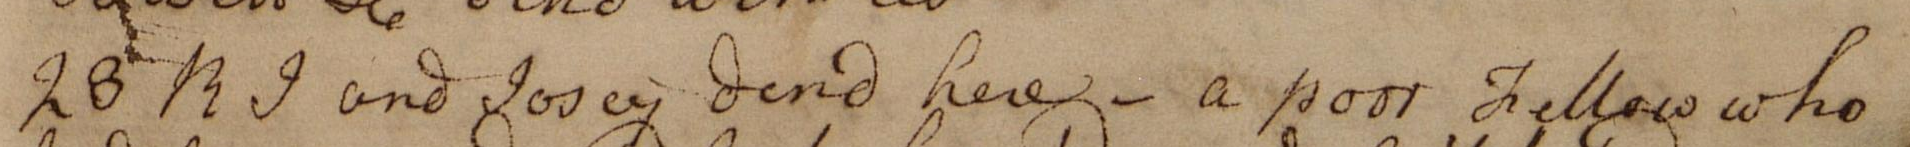23 RJ and Josey dind here- a poor Fellow who
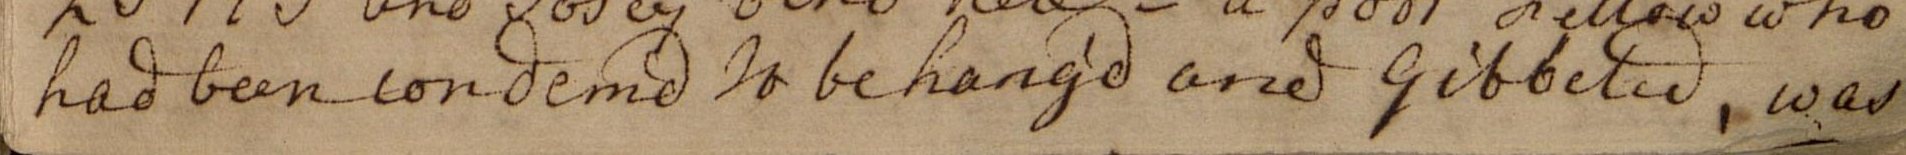had been condem'd to be hang'd and Gibbeted, was
